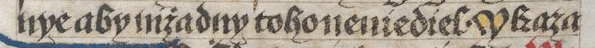nye aby niżadny toho neuíediel.Y kaza¬
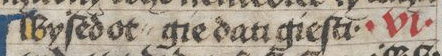ſkyẛed ot gie dati gieſti. i vi.
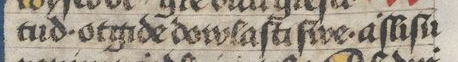tud.otgide dowlaſti ſwe.aẛli ſu
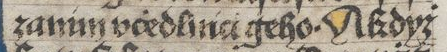za nim vċedlnici geho.A když
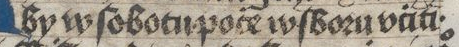by až ſobotu. poċe wſboru vċiti.
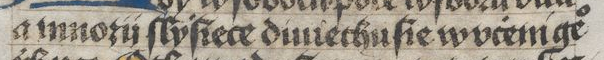a mnozij ſlyẛíece diuiechu ſie w vċení geo
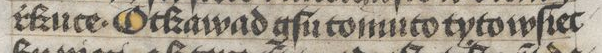ṙkuce.Otkawad gſu tomuto tyto wſiec¬
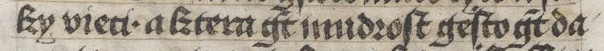ky vieci.a ktera ḡt mudroſt geẛto ḡt da¬
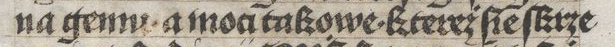na gemu.a moci takowe.ktereż ſie ſkrze
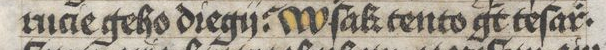rucie geho diegij? Wẛak tento ḡt teſaṙ.
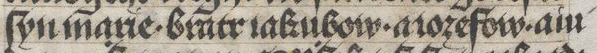ſyn marie.bratr iakubow.a iozefow.a iu¬
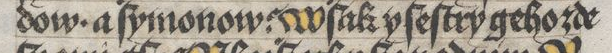dow.a ẛymonow?Wẛak y ſeſtry geho zde¬
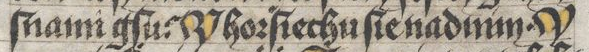ſnami gſu? Y horẛíechu ſie nad ním.Y
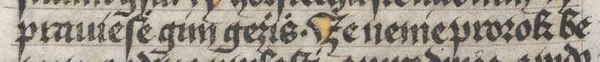prauíeẛe gím geżíṡ.Że neníe prorok be¬
